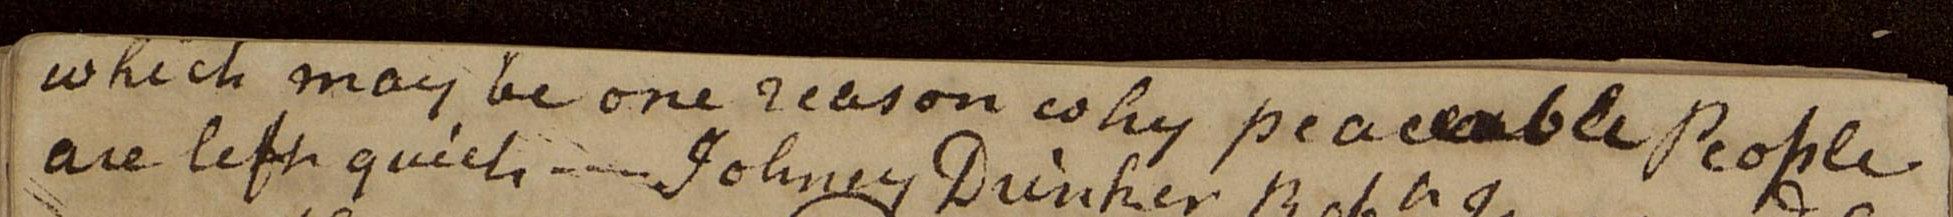which may be one reason why peaceable People
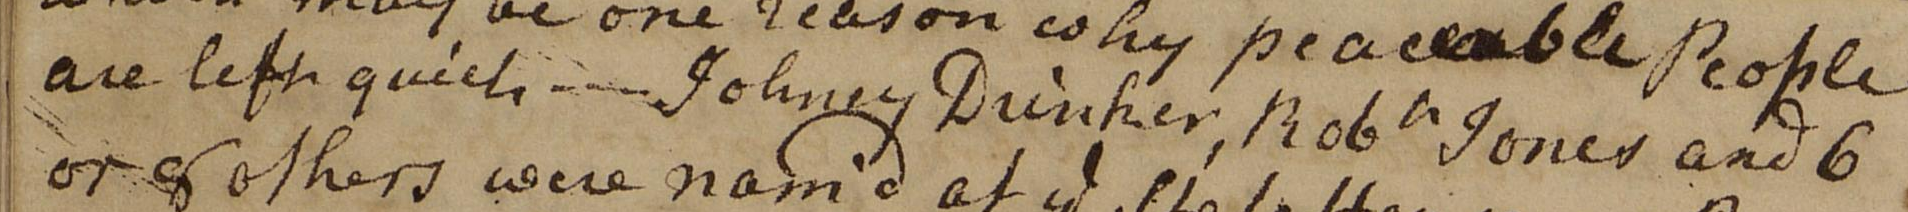are left quiet-- Johney Drinker, Rob^t Jones and 6
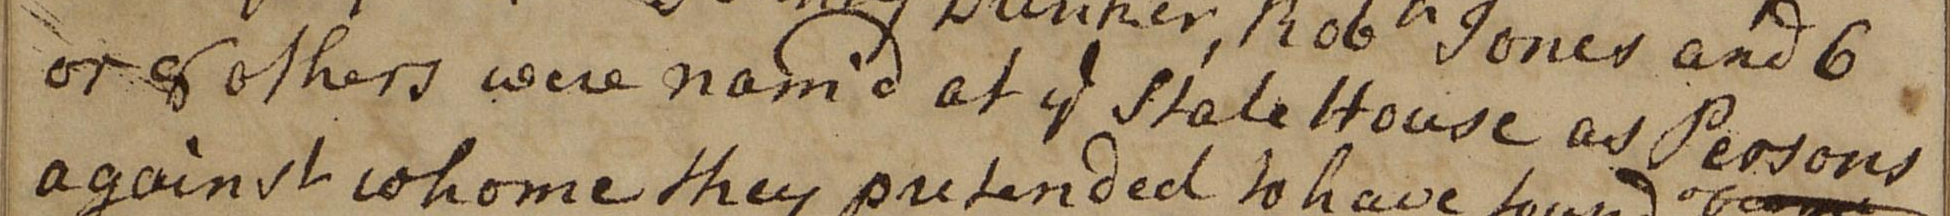or 8 others were nam'd at y^e State House as Persons
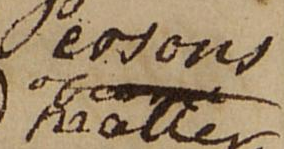of[____]
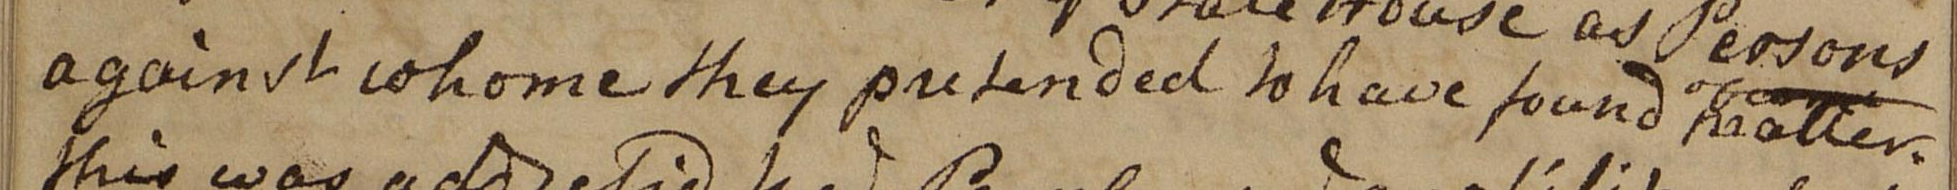against whome they pretended to have found matter.
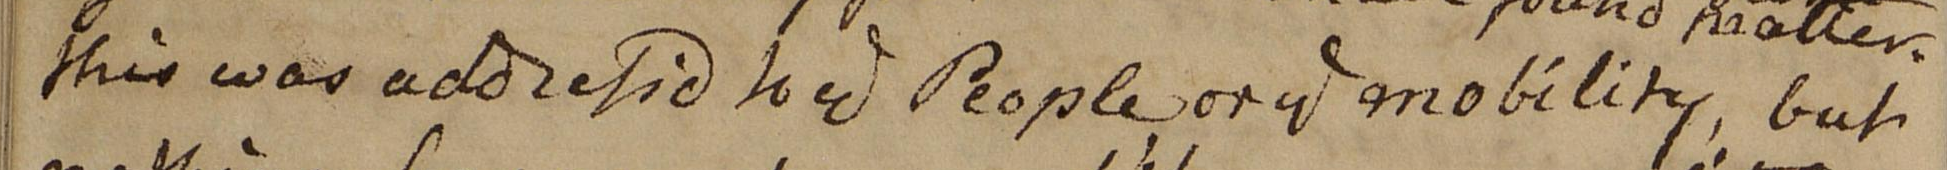this was address'd to y^e People or y^e mobility, but
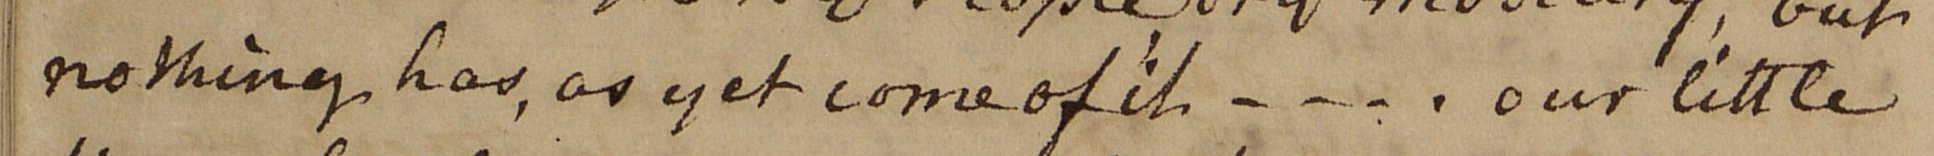nothing has, as yet come of it--- our little
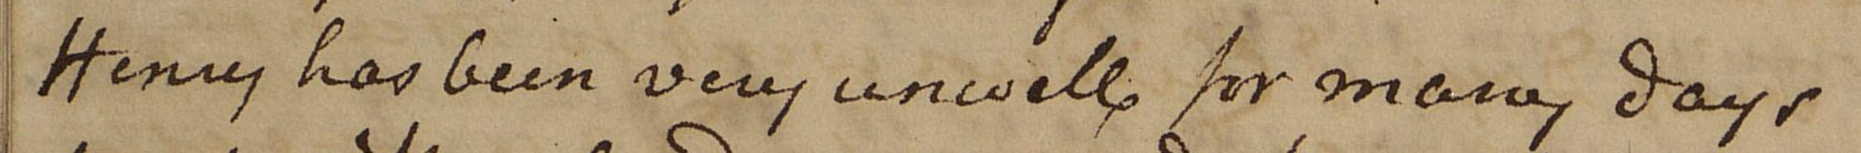Henry has been very unwell for many days
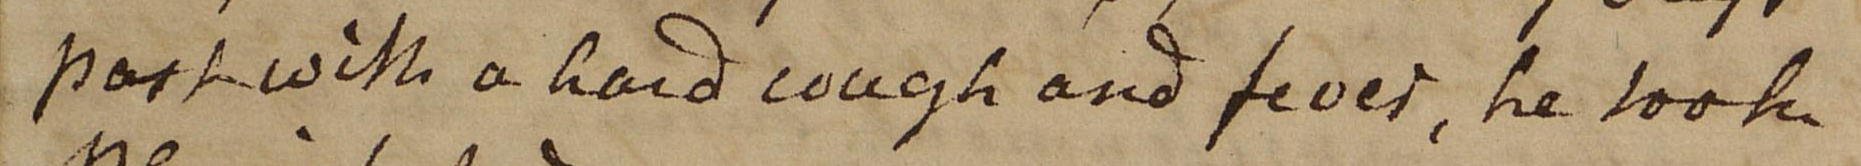part with a hard cough and fever, he took
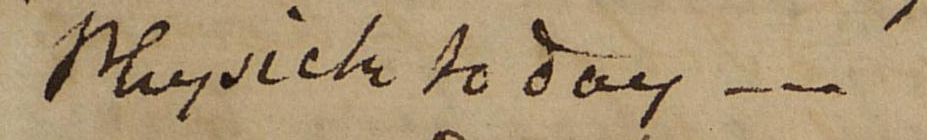Physick to day--
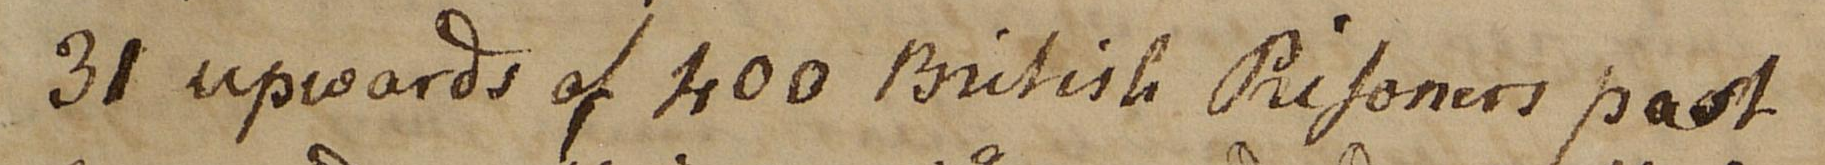31 upwards of 400 British Prisoners past
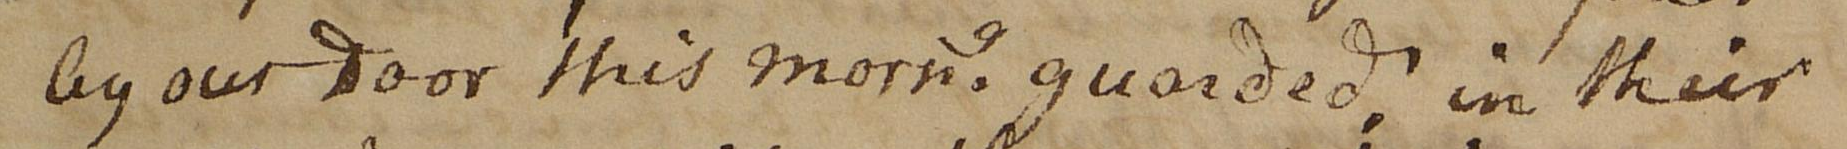by our Door this morn^g. guarded, in their
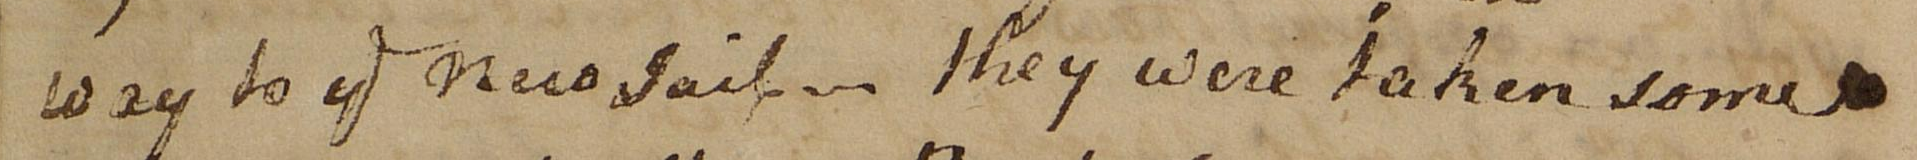way to y^e new Jail- they were taken some
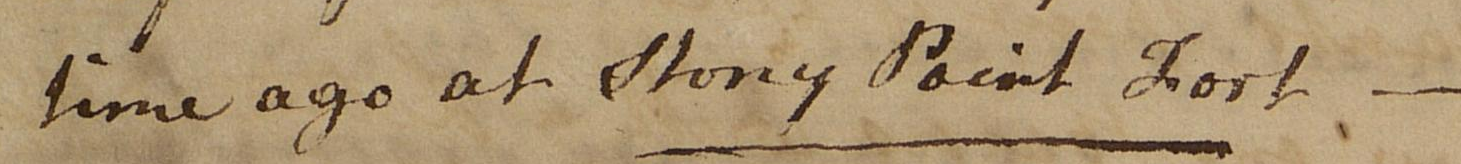time ago at Stony Point Fort-
